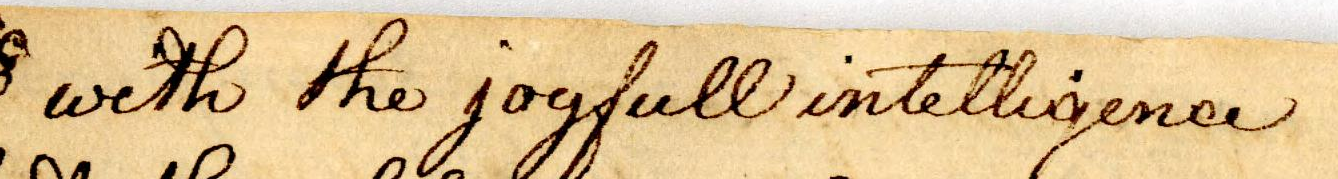with the joyfull intelligence
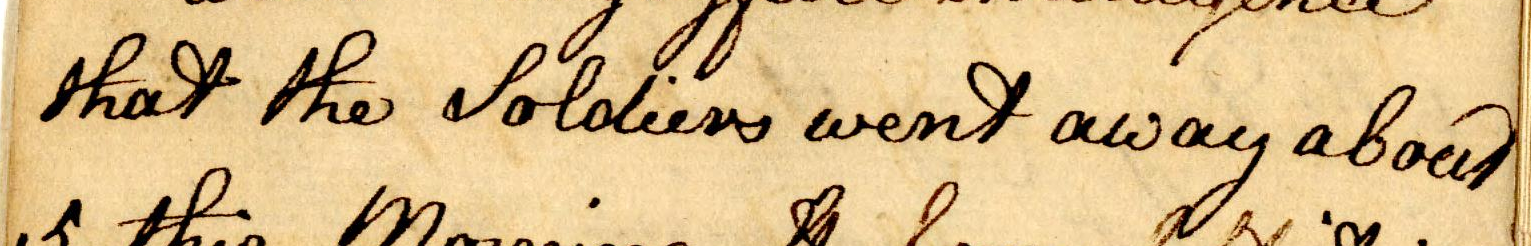that the Soldiers went away about
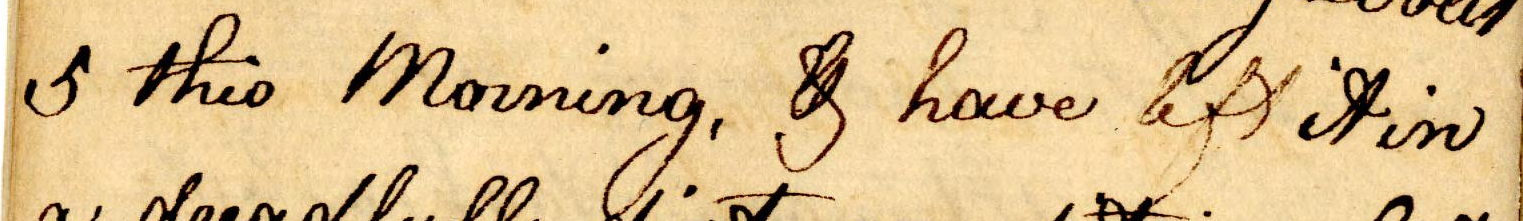5 this Morning, & have left it in
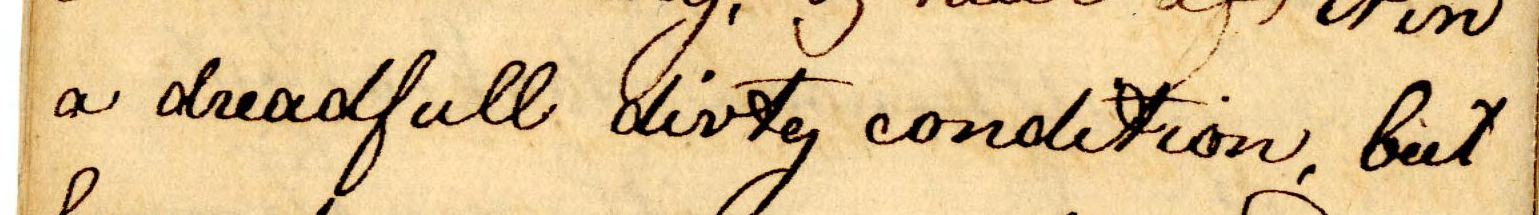a dreadfull dirty condition, but
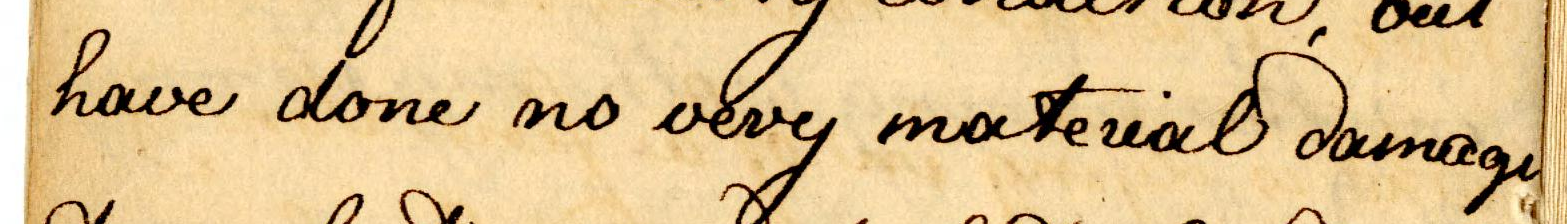have done no very material damage
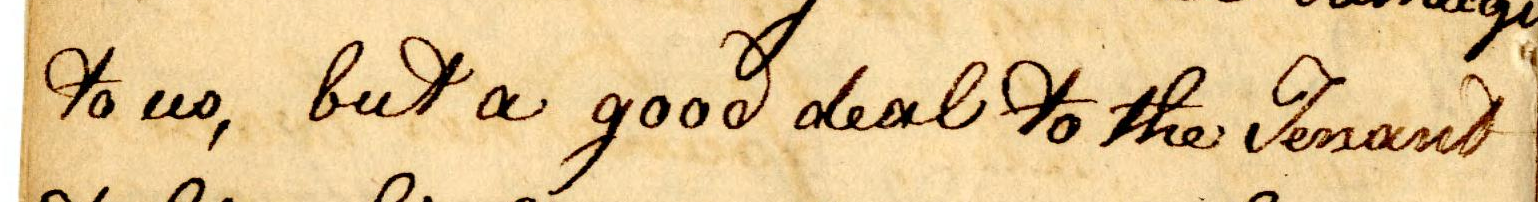to us, but a good deal to the Tenant
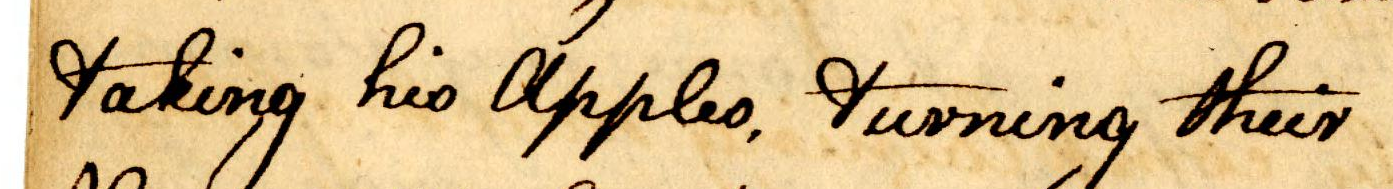taking his Apples, turning their
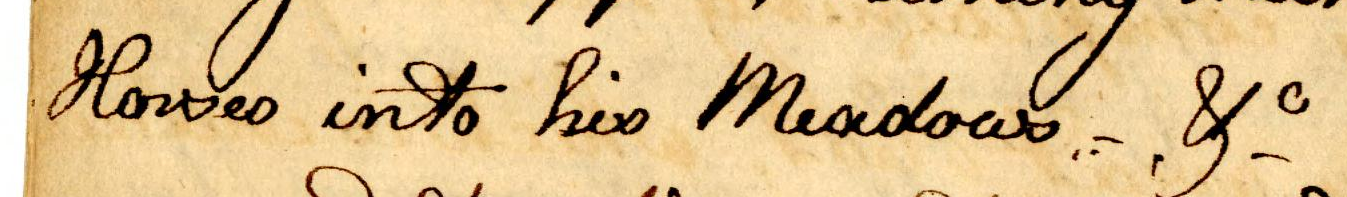Horses into his Meadows- &^c
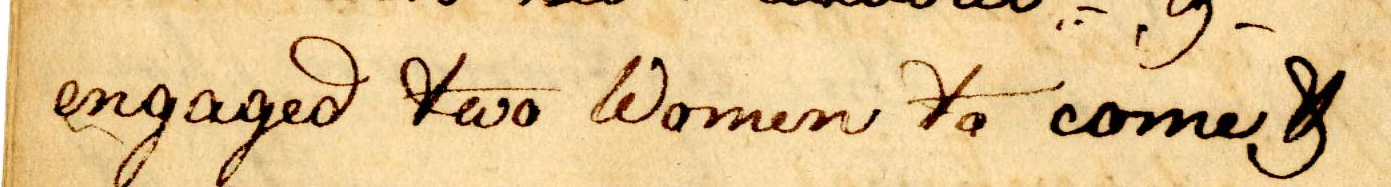engaged two Women to come &
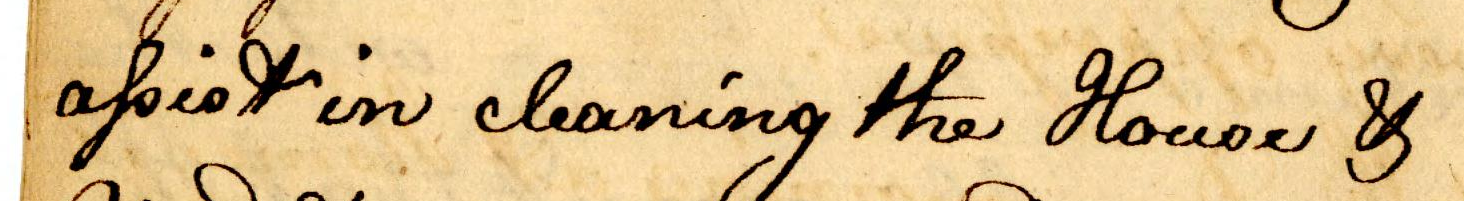assist in cleaning the House &
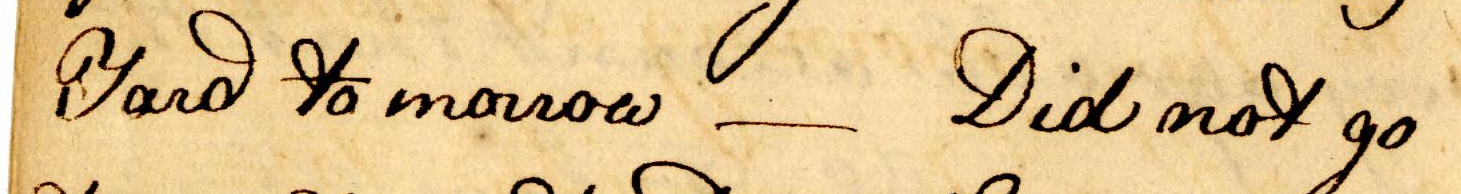Yard tomorrow- Did not go
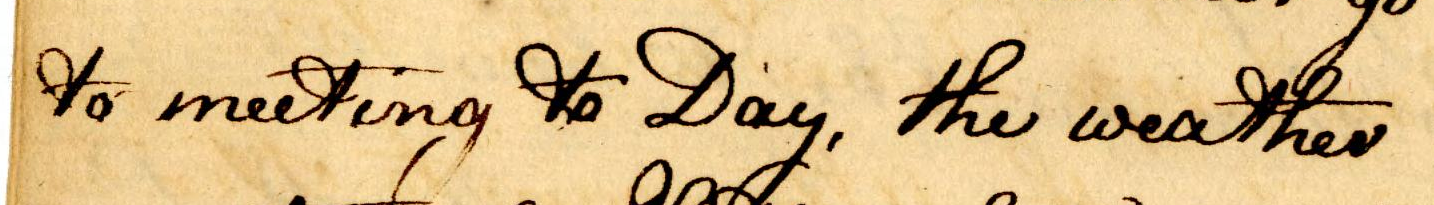to meeting to Day, the weather
